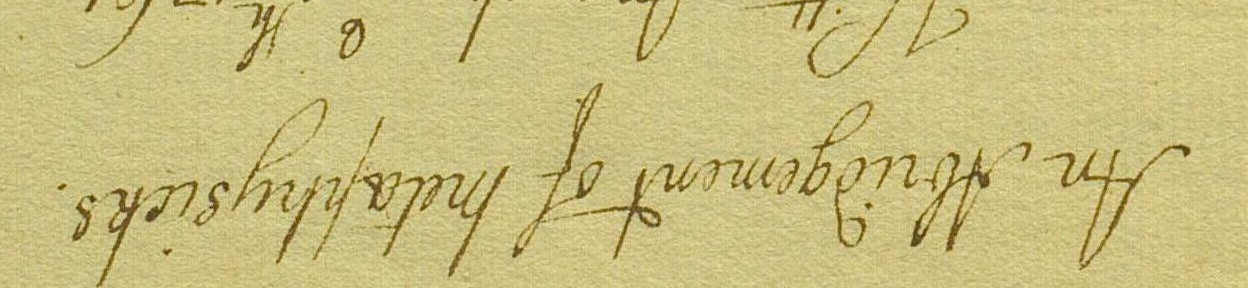An Abridgement of Metaphysicks.
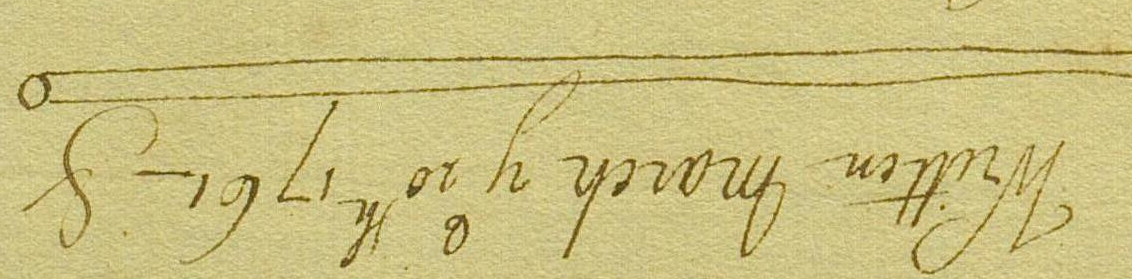Written March y^e 20^th 1761- &
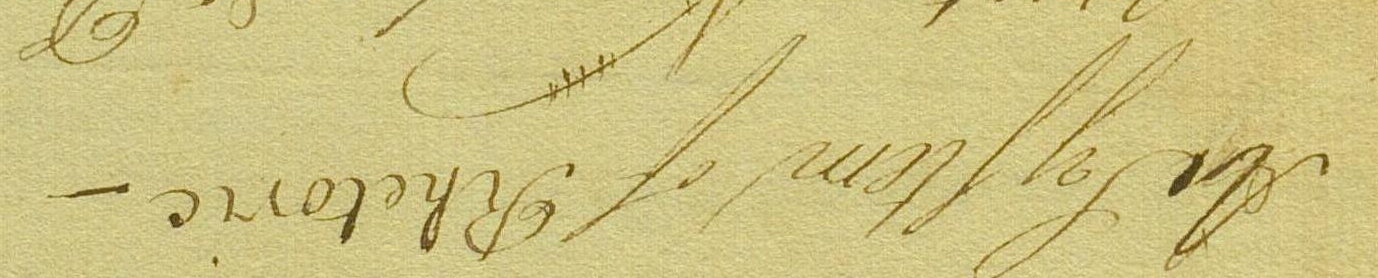A System of Rhetoric-
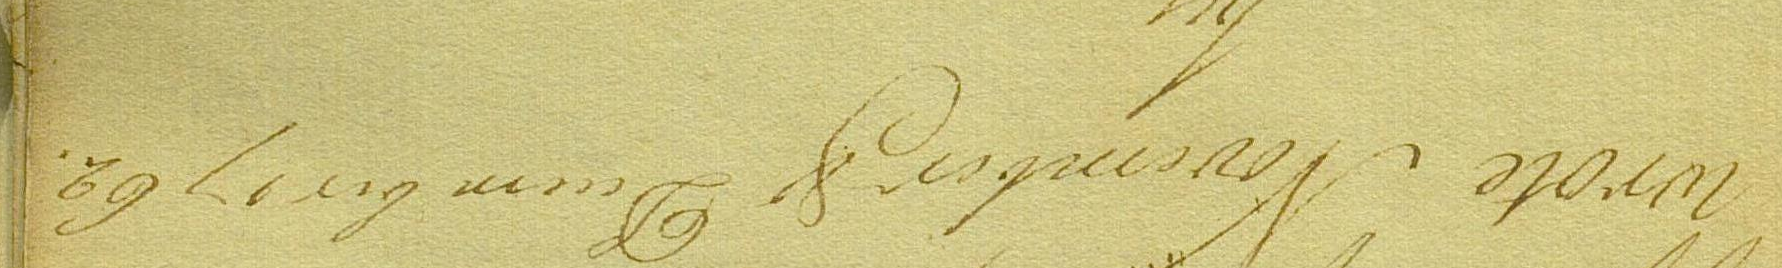wrote November & December 1769.
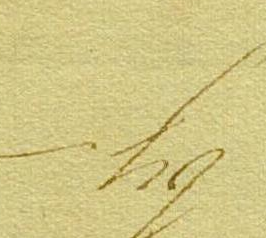by-
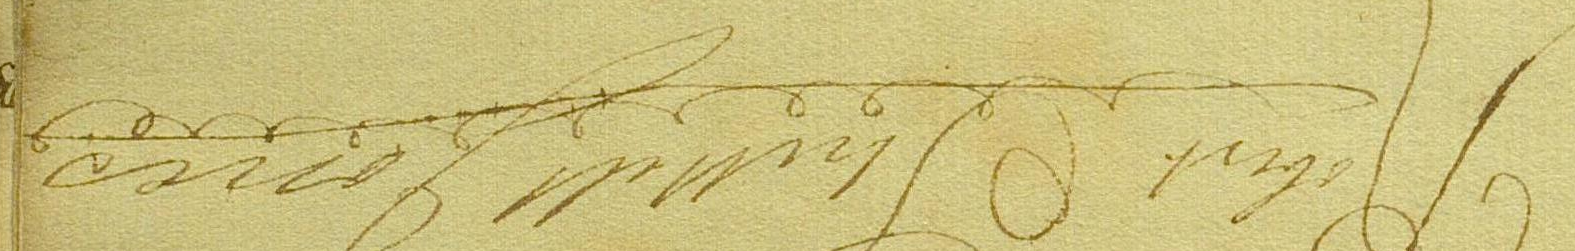Robert Strettell Jones
